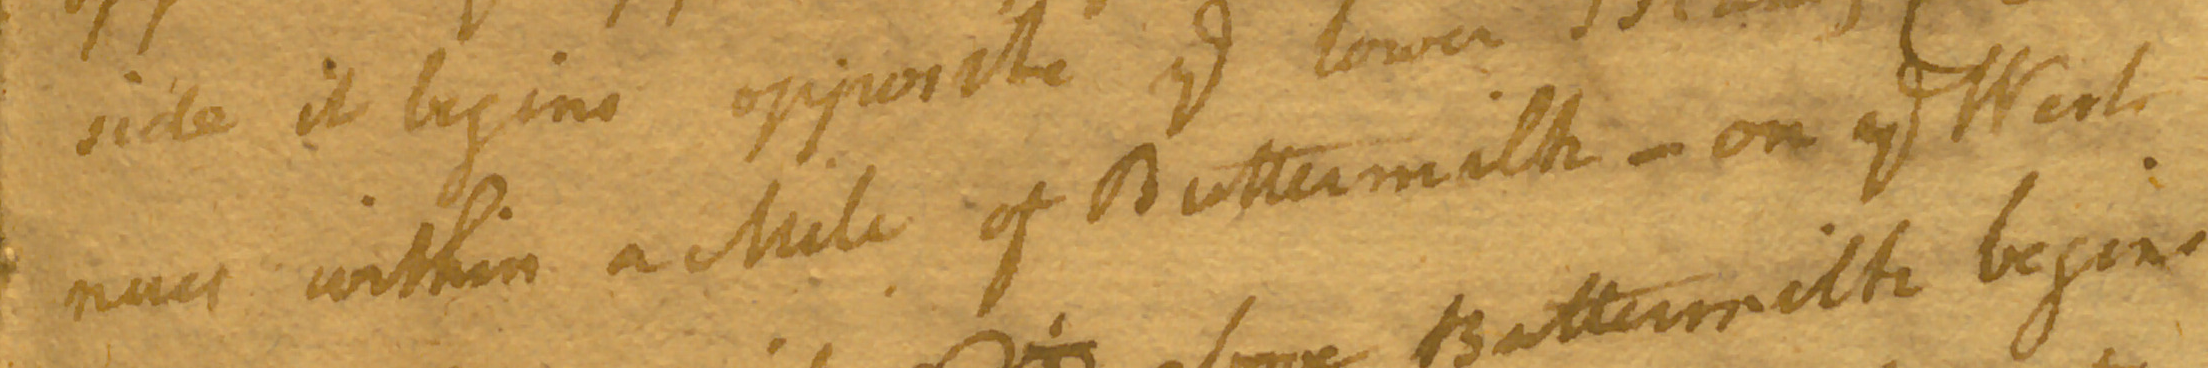nues within a Mile of Buttermilk- on y^e West
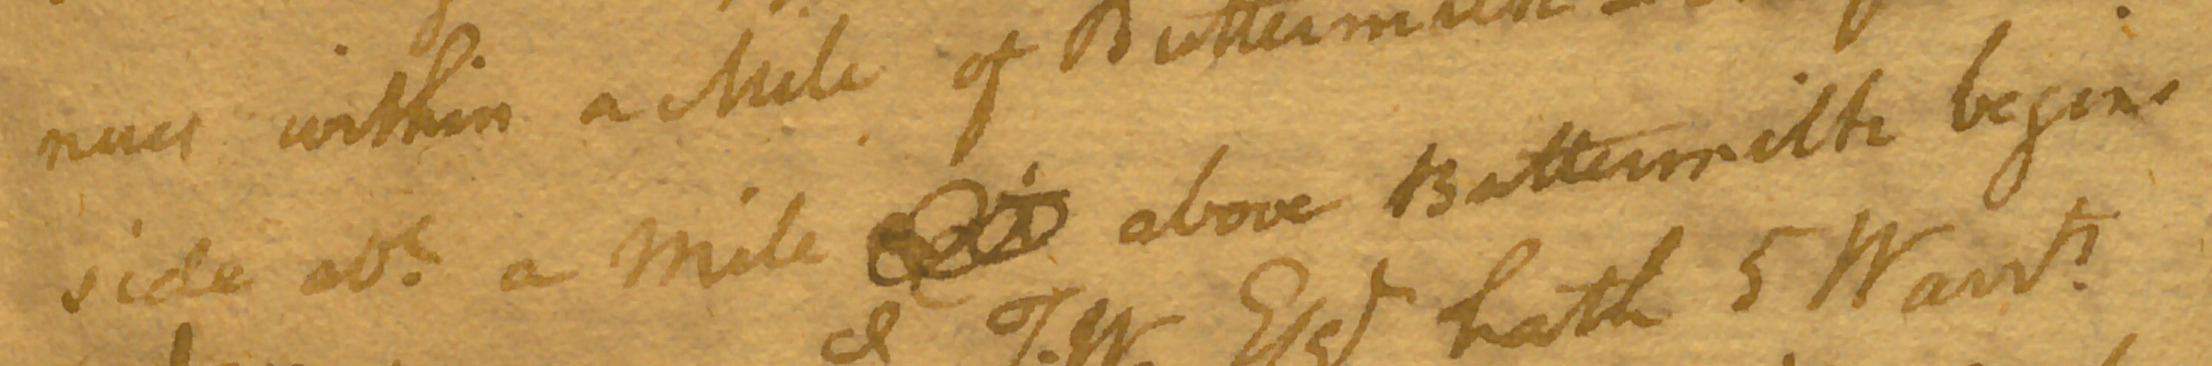side ab^t. a mile [___] above Buttermilk begins
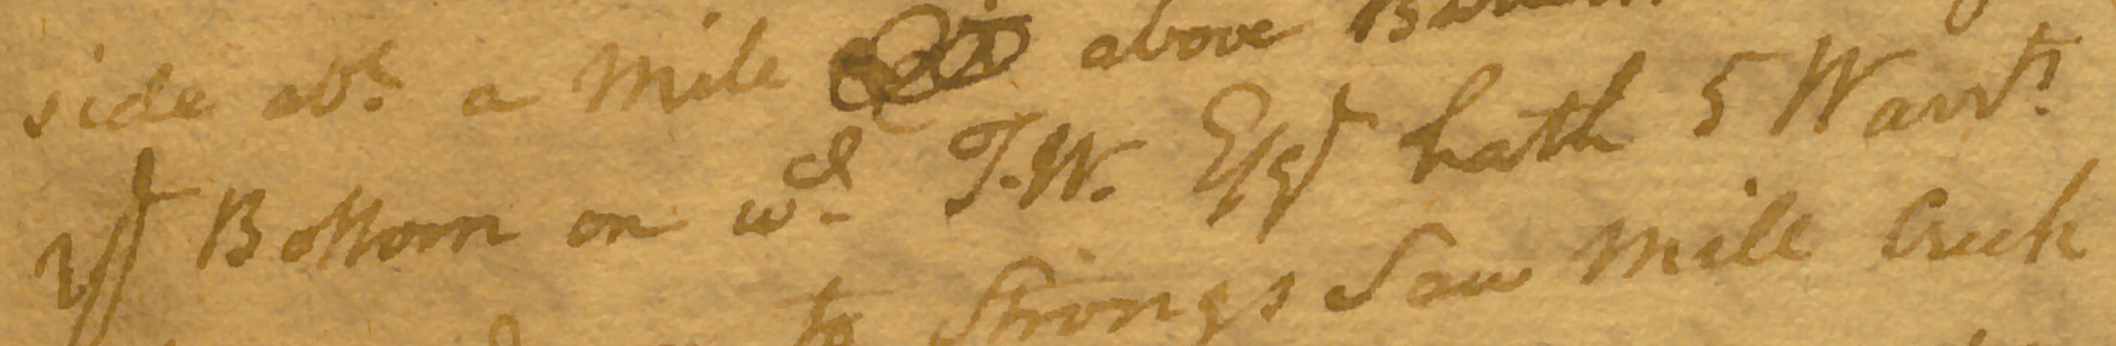y^e Bottom on w^ch. J. W. Esq^r hath 5 Warrt^s.
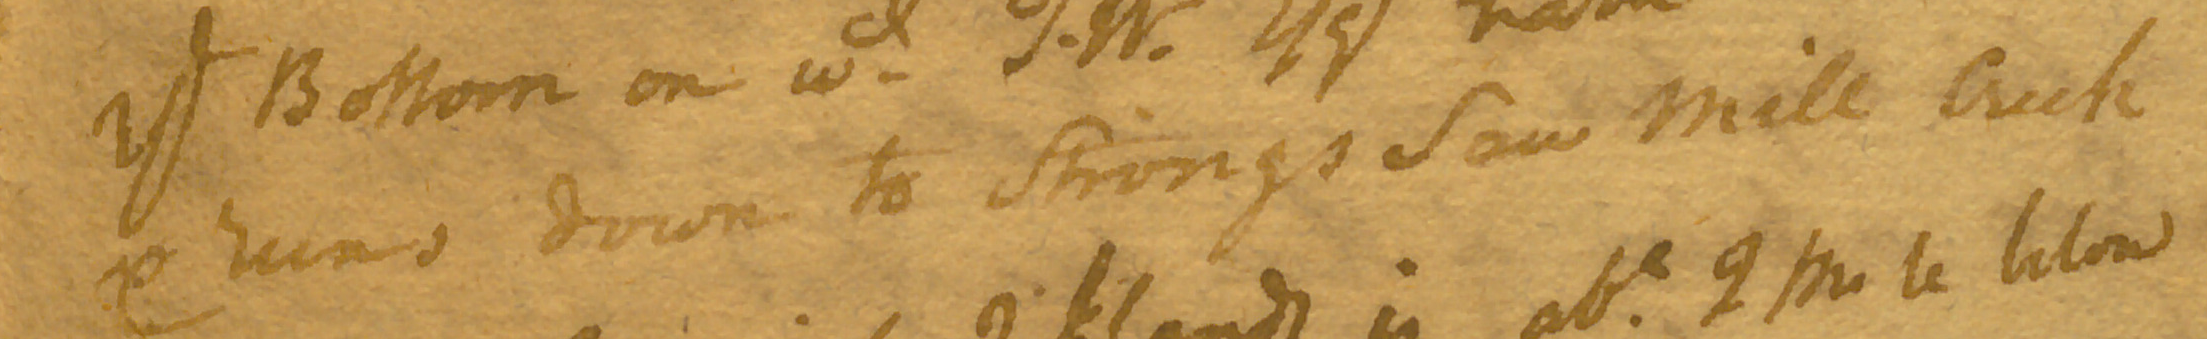& runs down to Strings Saw Mill Creek
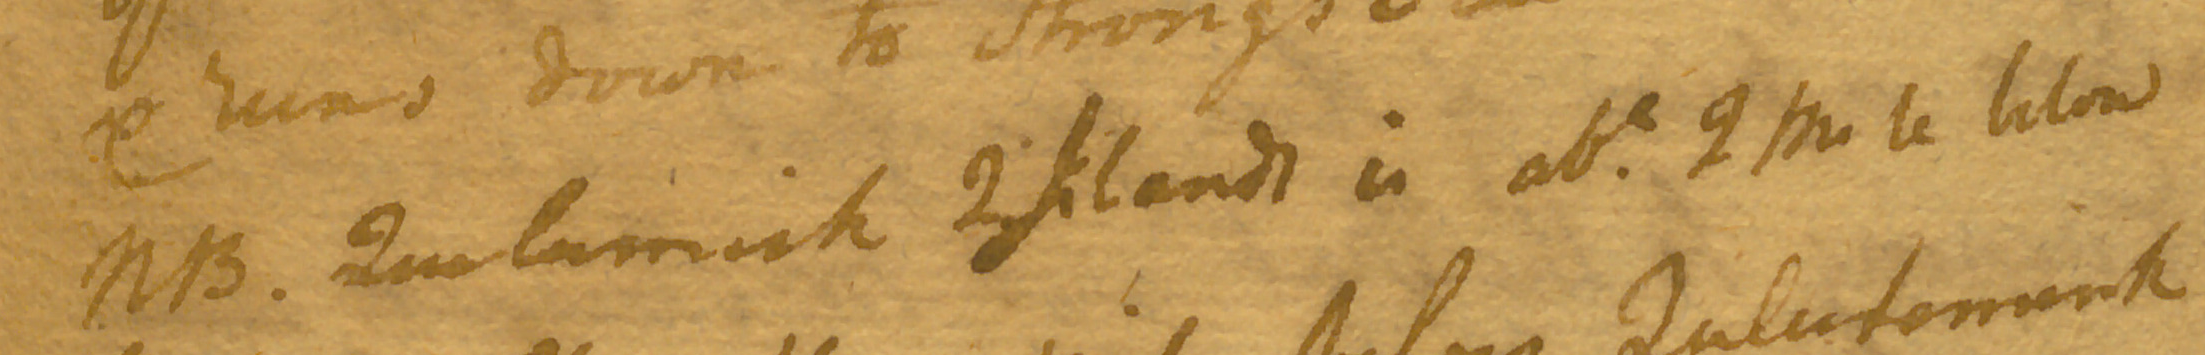NB. Qualumink 2 islands is ab^t. 2 mile below
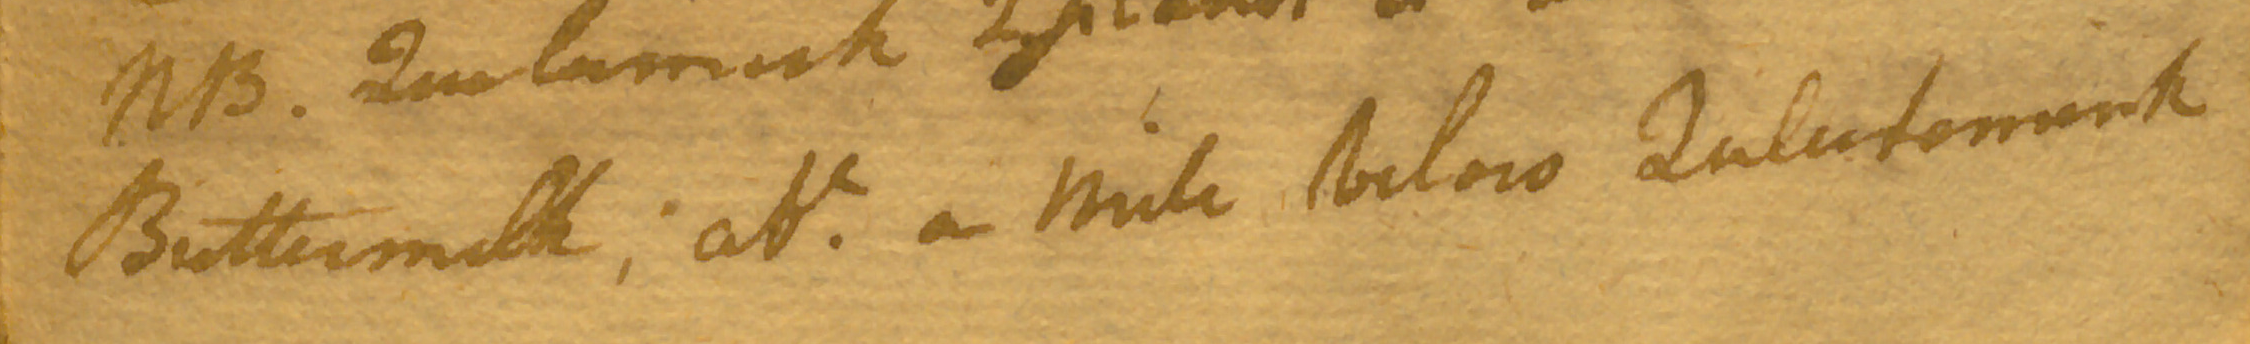Buttermilk, ab^t. a mile below Qualutemink
